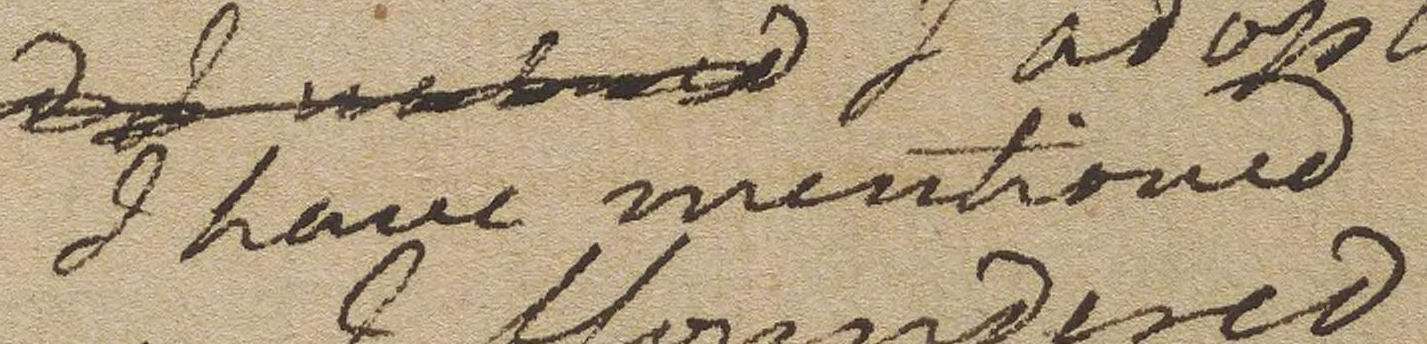I have mentioned
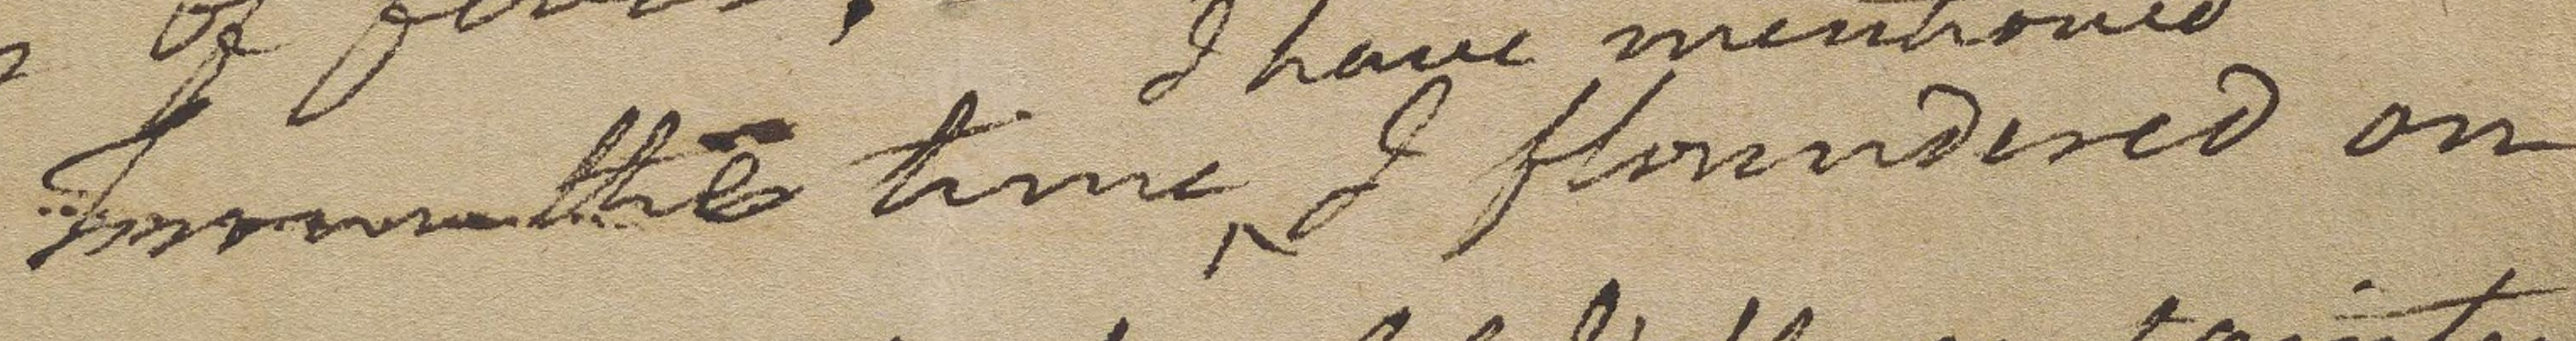From the time ^ I floundered on
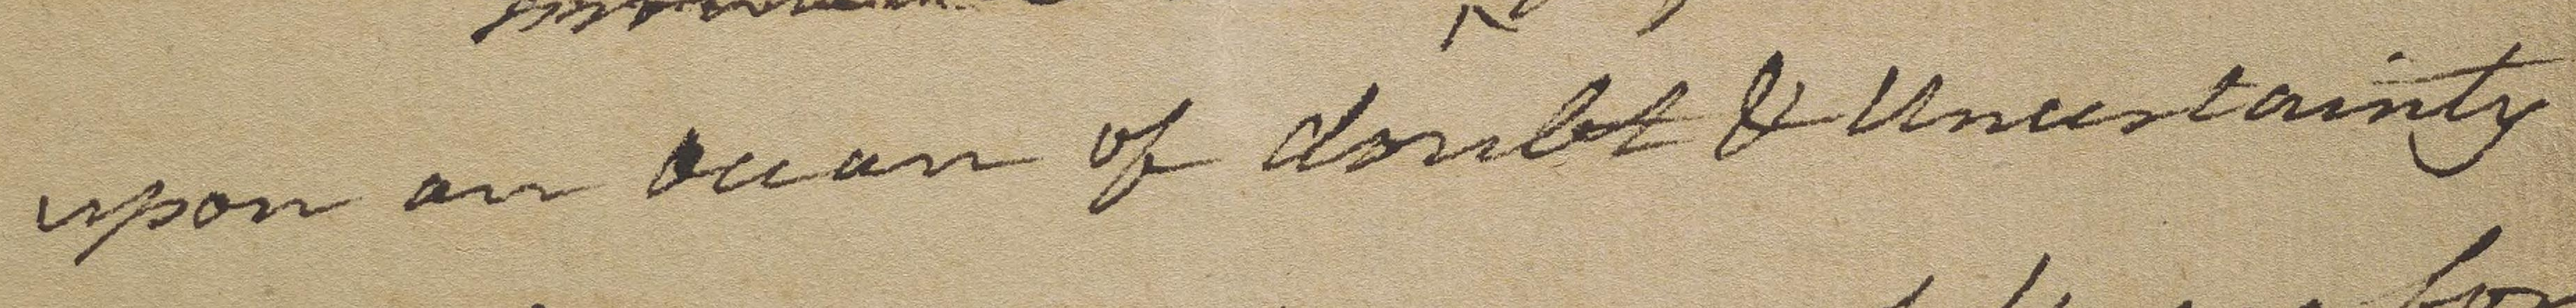upon an ocean of doubt & uncertainty
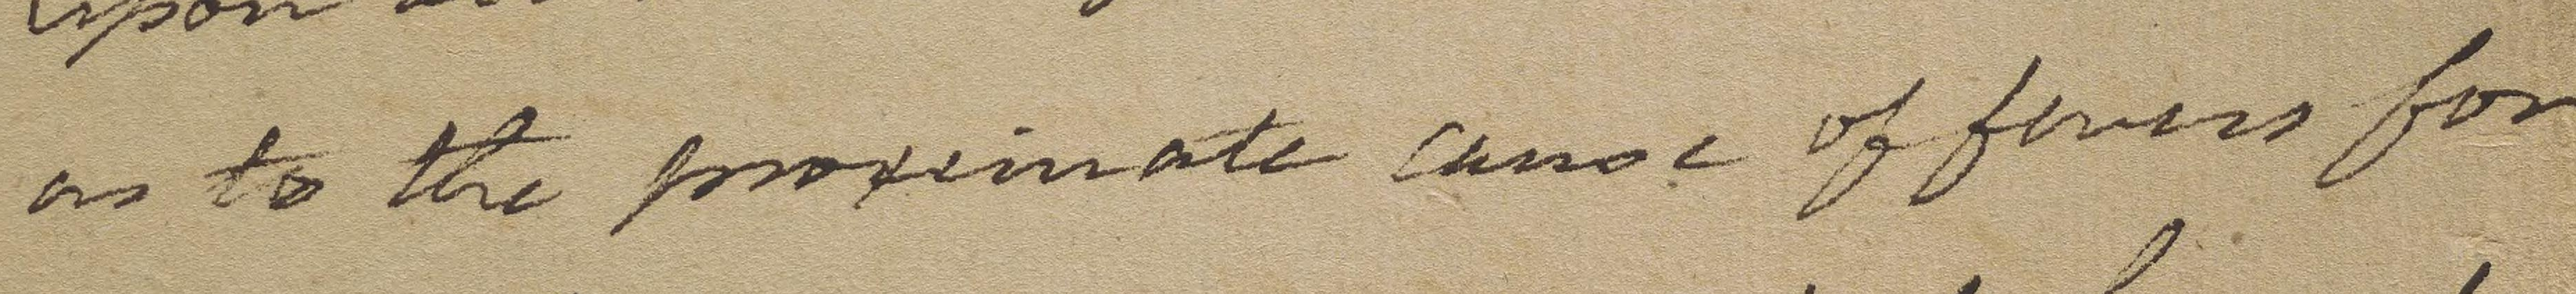as to the proximate cause of fevers for
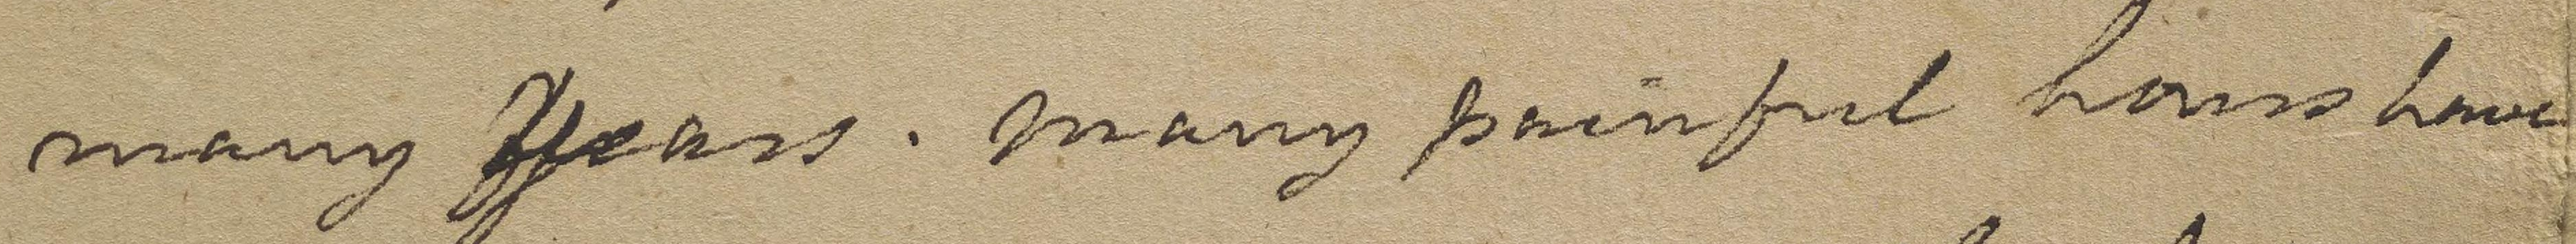many years. many painful hours have
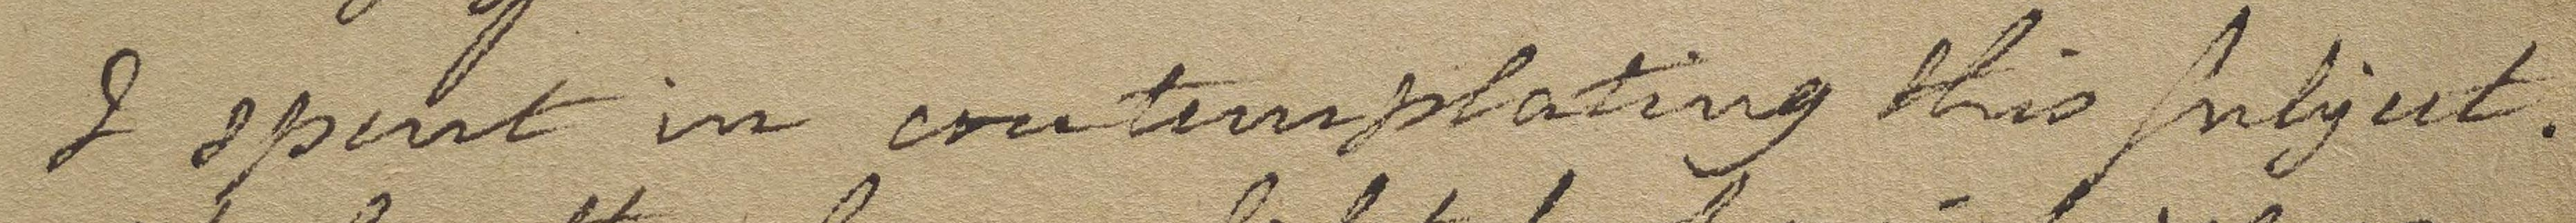I spent in contemplating this subject
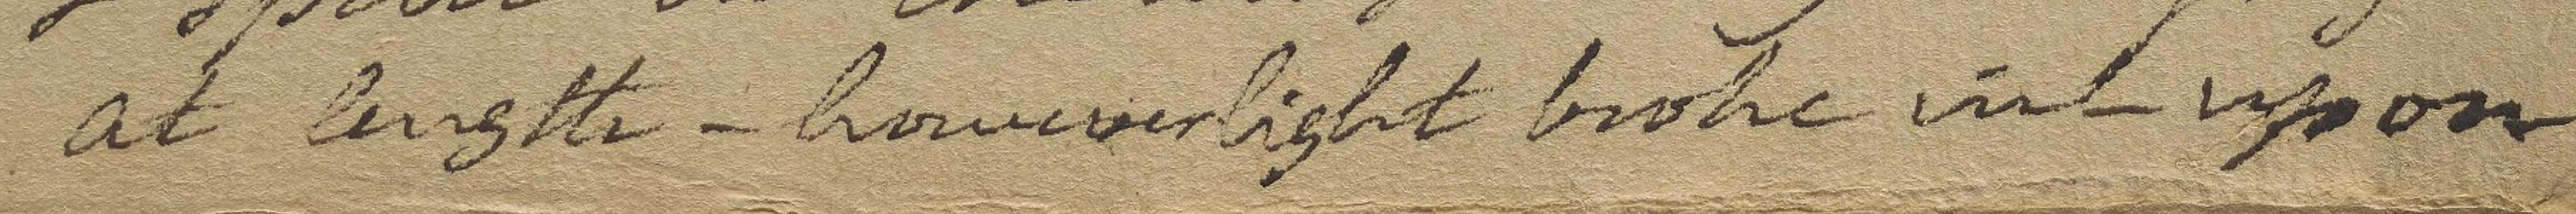at length- however light broke in upon
